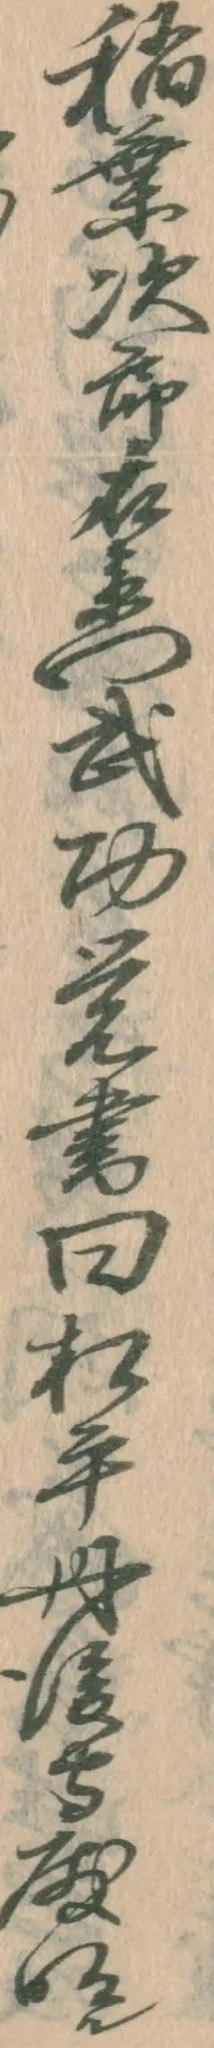稲葉次郎右衛門武功覚書曰松平丹後紙殿明る
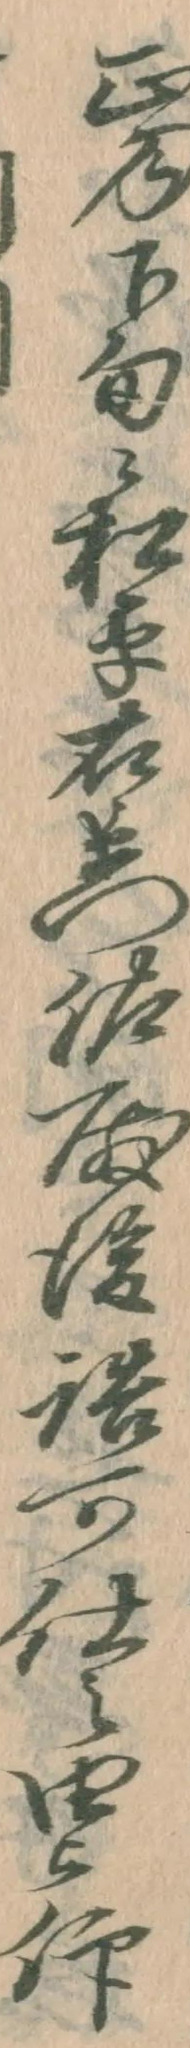正月下旬に松平右衛門佐殿御詰可仕之由被仰
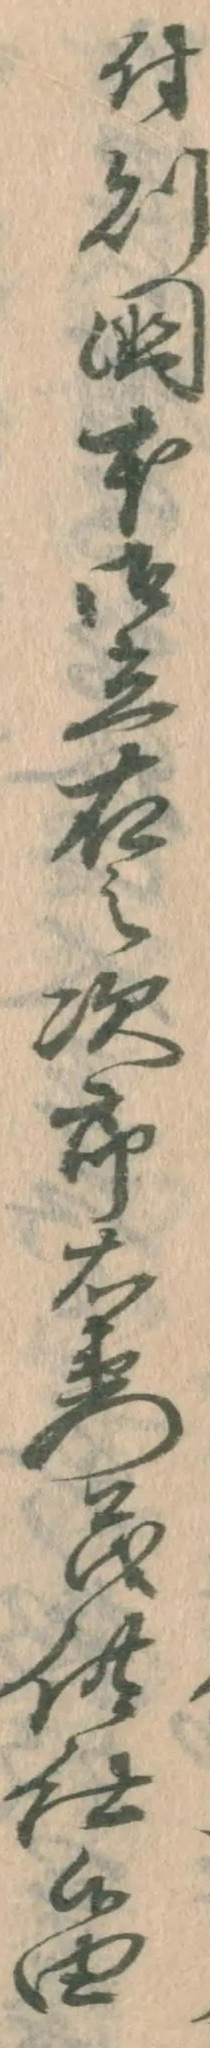付則国本御立右之次郎右衛門茂供仕候由
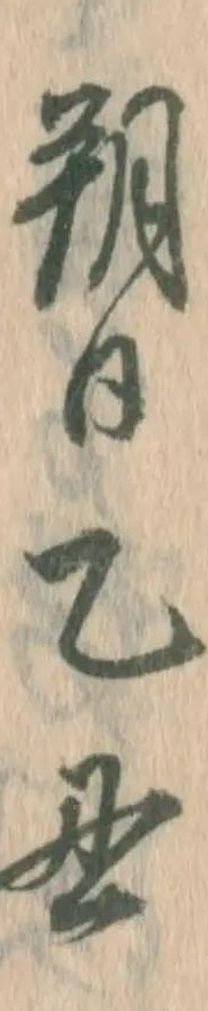朔日乙丑
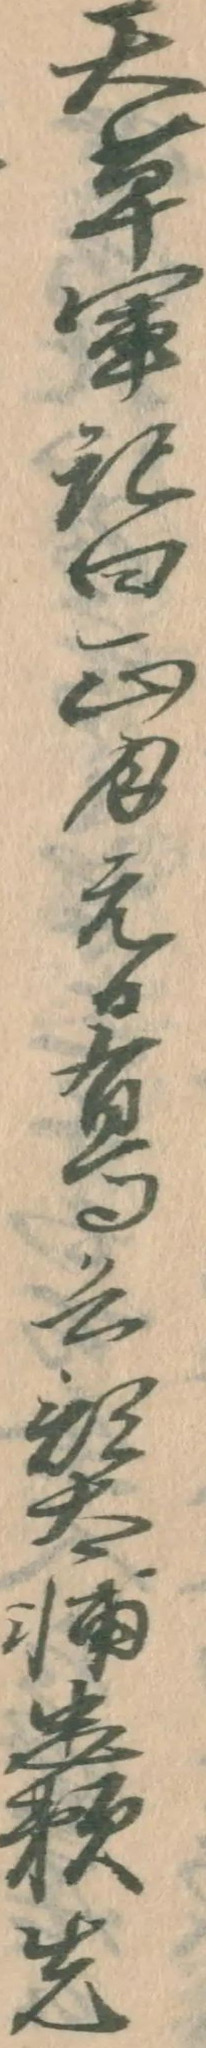天草軍記曰正月元日有馬兵部太輔忠頼先
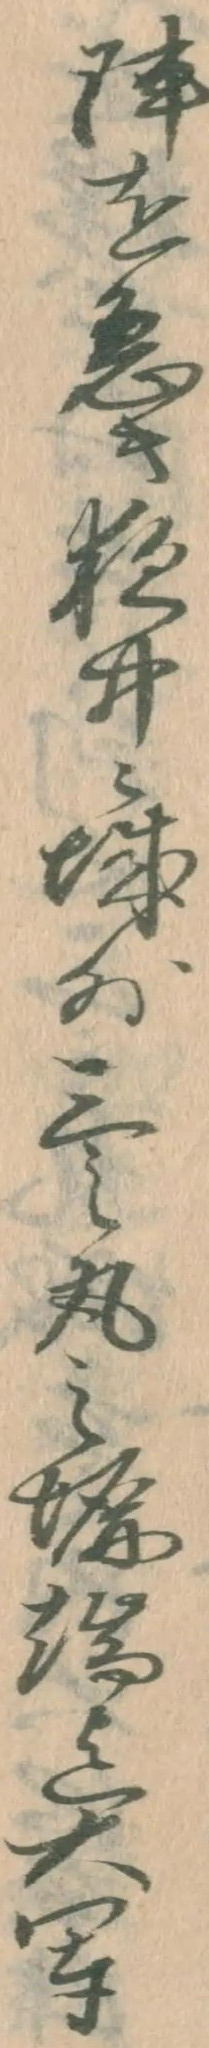陣を急き夜中に城外三之丸平端迄大軍

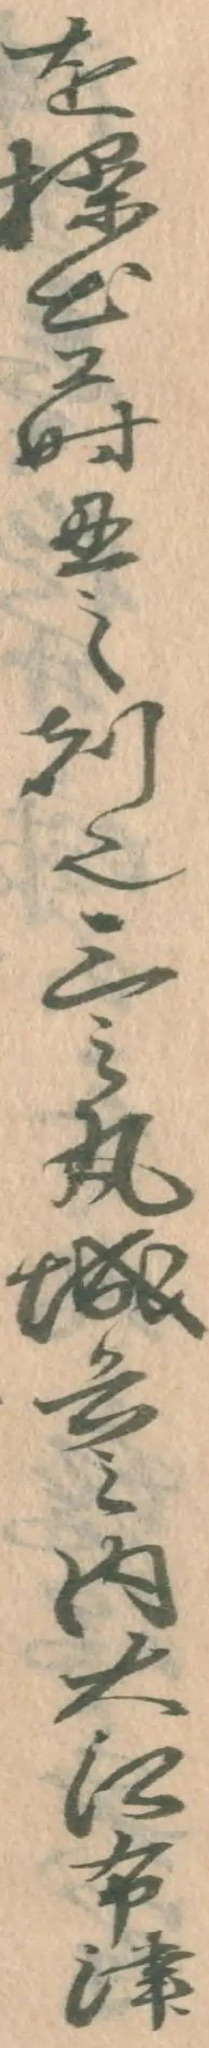を操出す時丑之刻也三之丸城兵之内大江布津
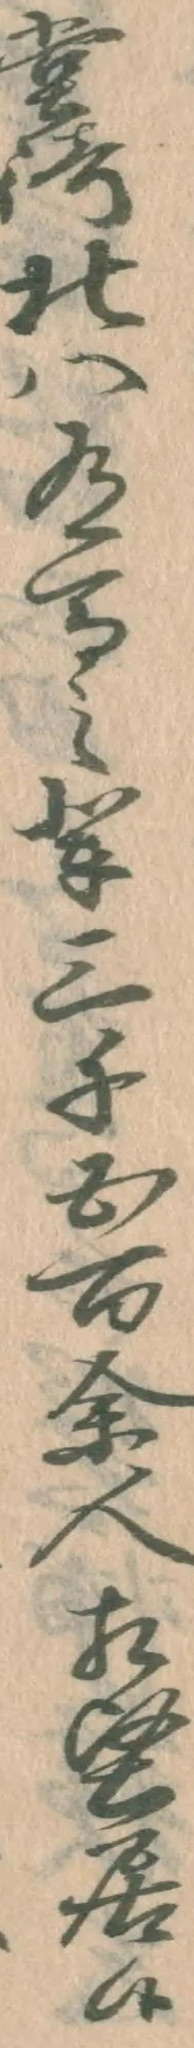堂崎北へ有馬之輩三千五百余人相堅居候
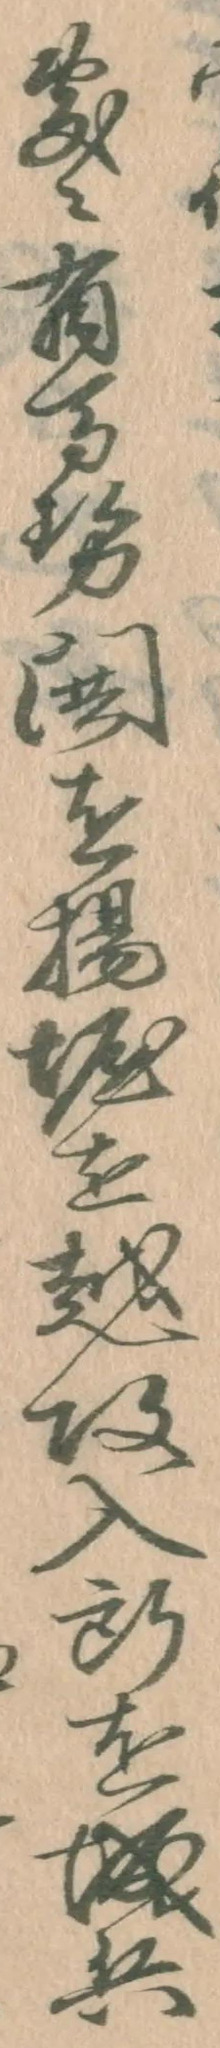處に有馬勢鬨を揚堀を越攻入所を城兵
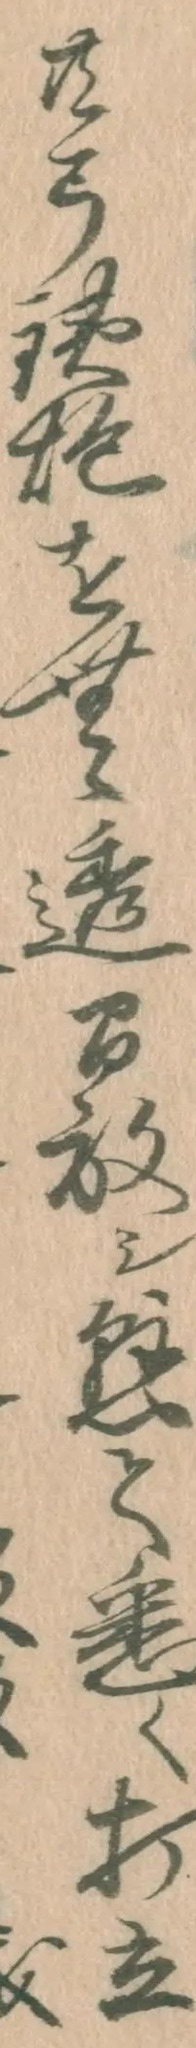共弓鉄炮を無透間放し懸て悉く打立
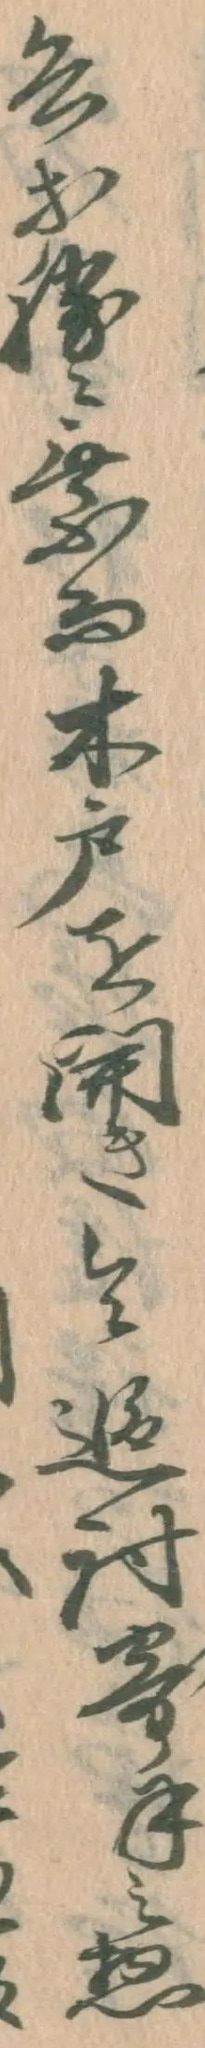兵等勝に乗而木戸を開き令追討寄手之惣
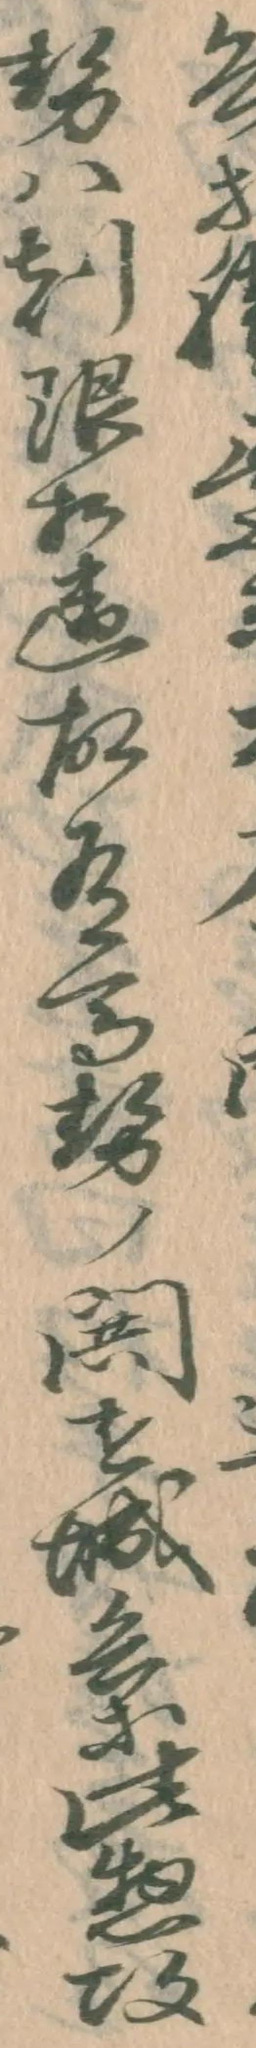勢は刻限相達故有馬勢之鬨を城兵等此惣攻
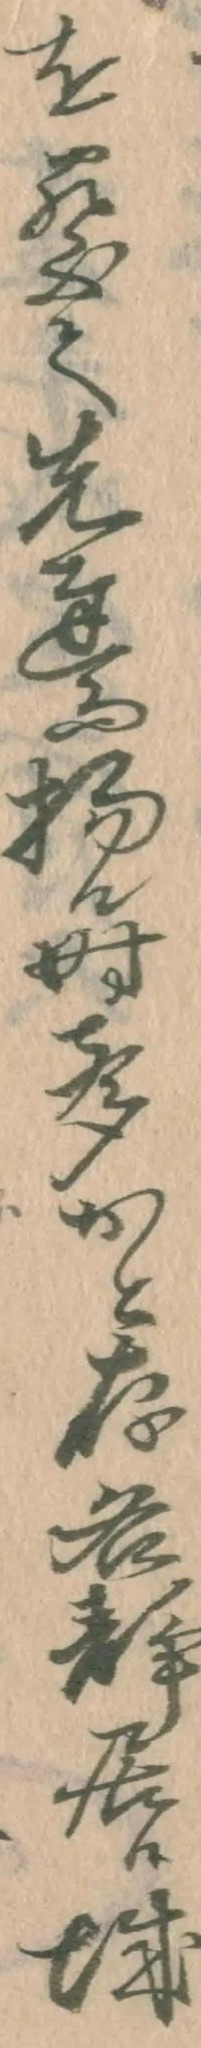を察て先達而揚候時声かと存各静居候城
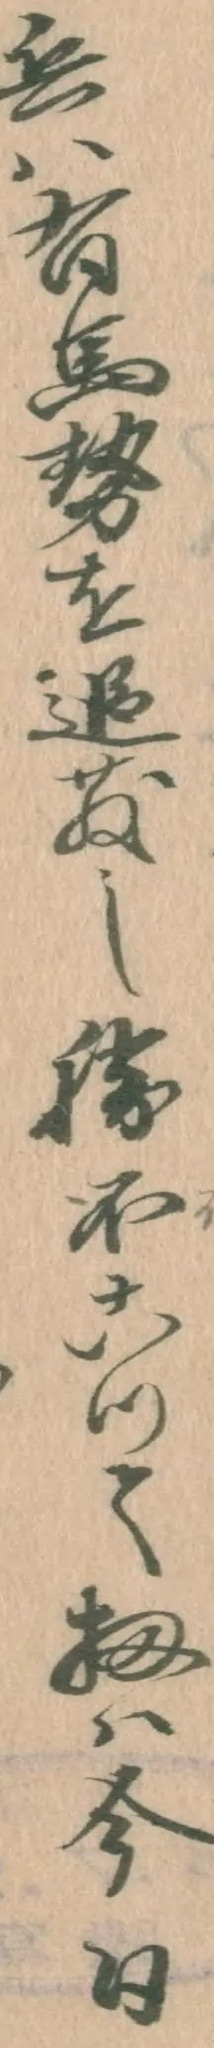兵は有馬勢を退散し勝不古川て扨は今日
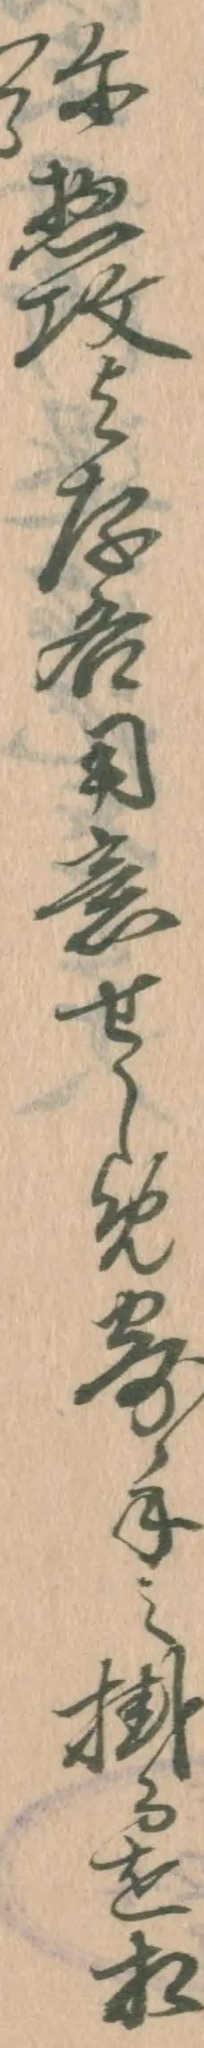弥惣攻与存各用意せし免寄手之掛るを相
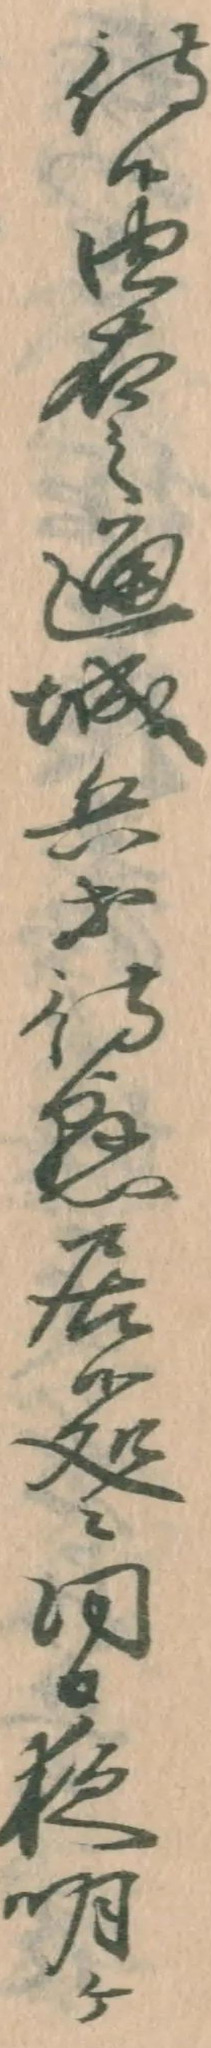待候由右之通城兵等待懸居候処に同日夜明け
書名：切支丹御退治記 49巻. [5]
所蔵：国立国会図書館 National Diet Library, JAPAN
